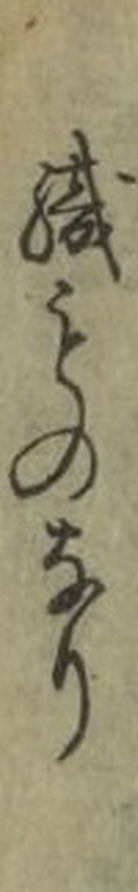織ものなり

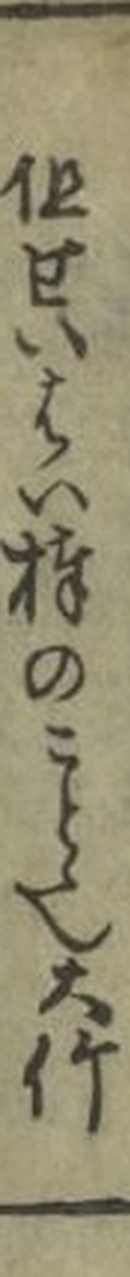但せいはい棒のこと也大竹
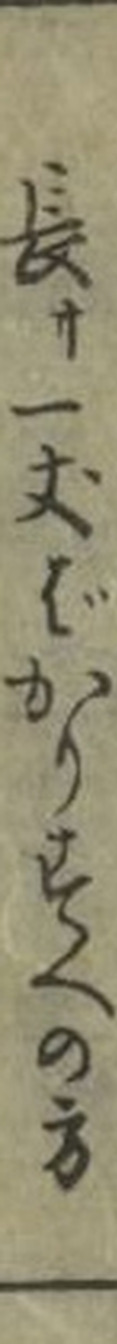長サ一丈ばかりすへの方
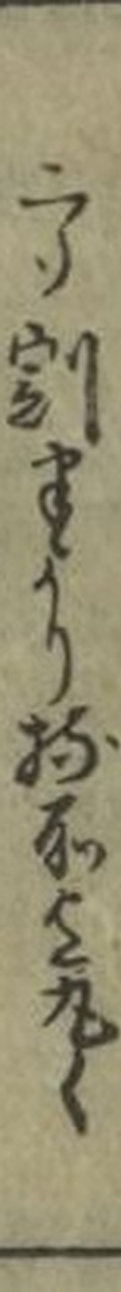ニツ割半より持所迄丸く
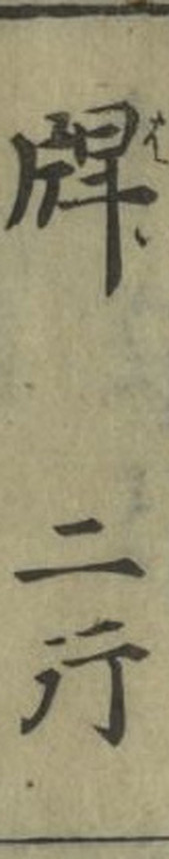牌二行
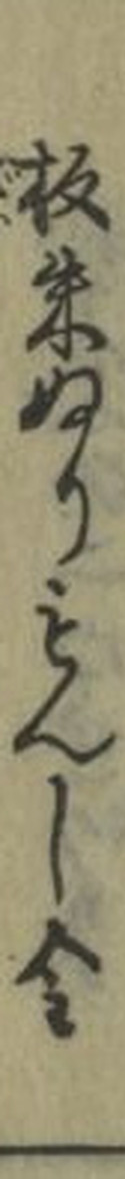板朱ぬりもんし金
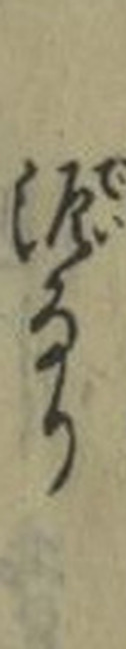泥なり
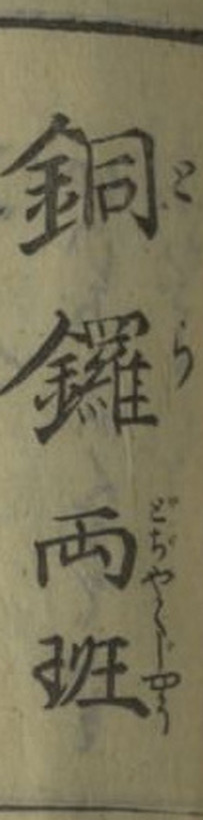銅鑼両班
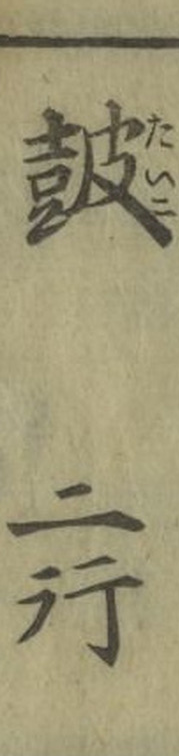鼓二行

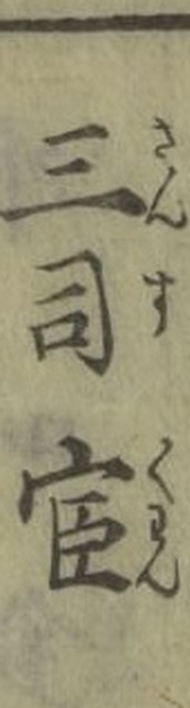三司宦
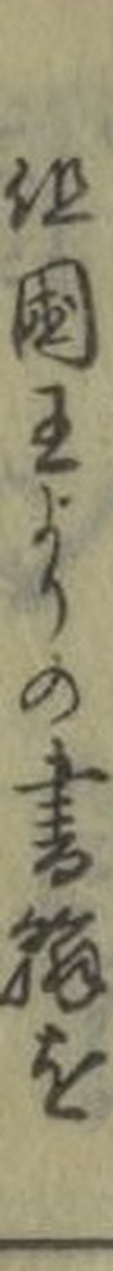但国王よりの書翰を
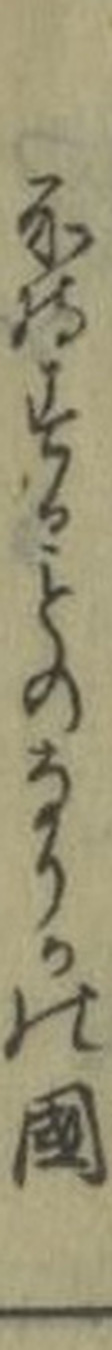所持するものなりかの国
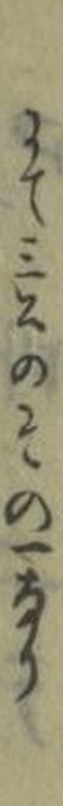にて三公のその一なり
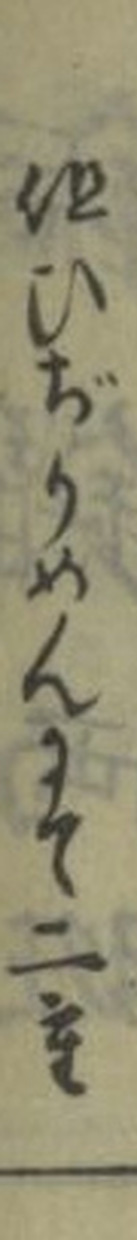但ひぢりめんにて二重
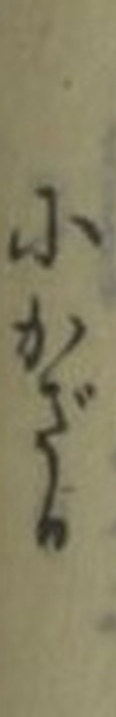にかざる
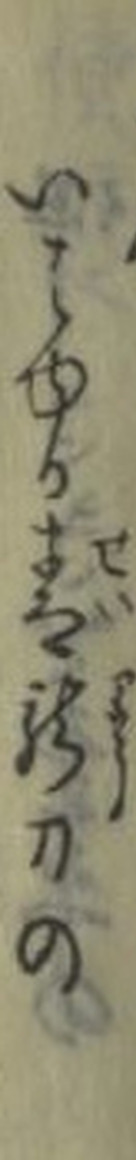いはゆる青龍刀の
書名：琉球人行列記
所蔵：University of the Ryukyus Library
